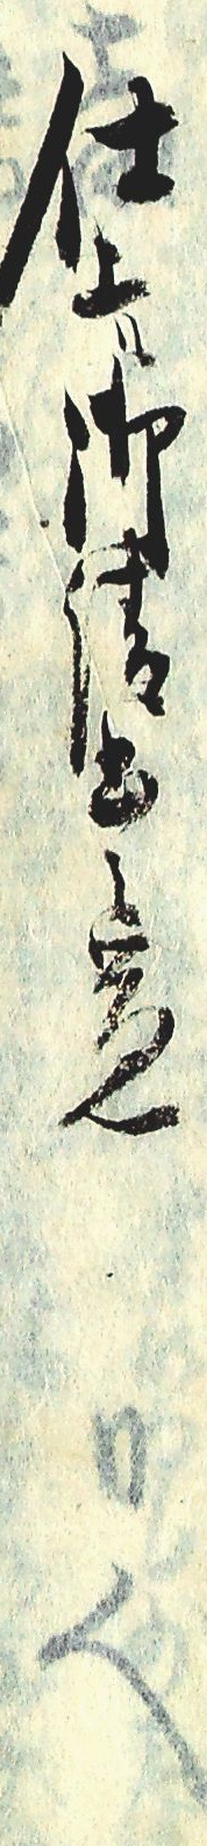仕上る御請書之覚
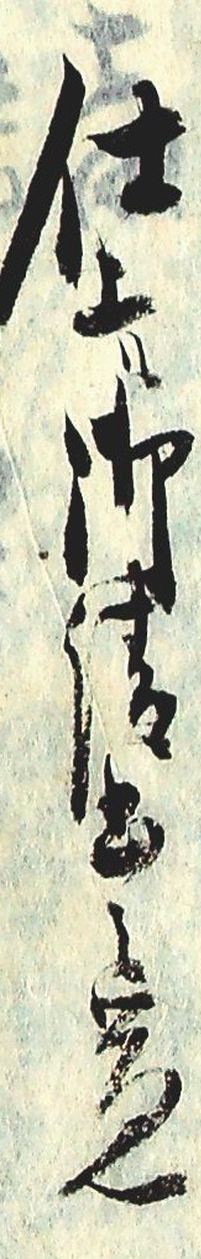仕上る御請書之覚
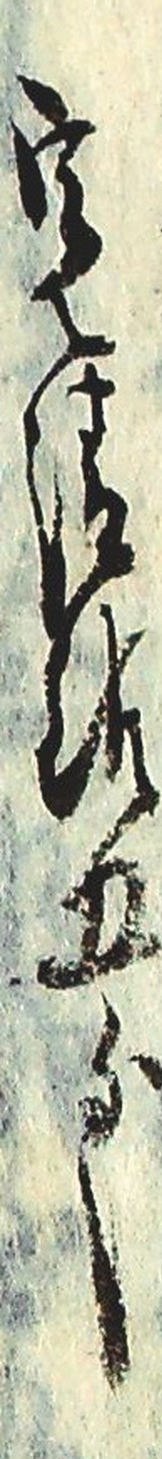定請銀五匁
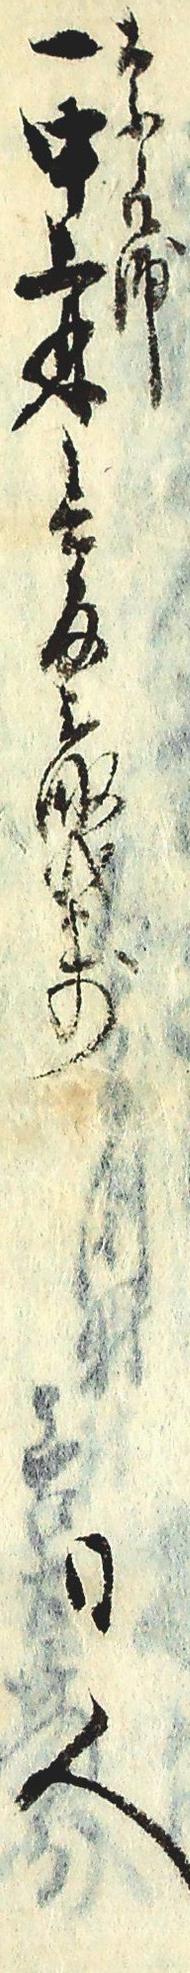一中上林壱反三畝弐歩同人
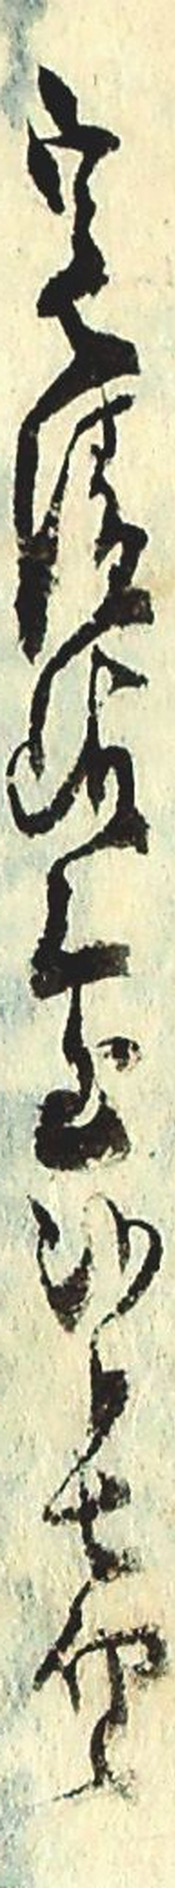定請銀三匁弐分七厘
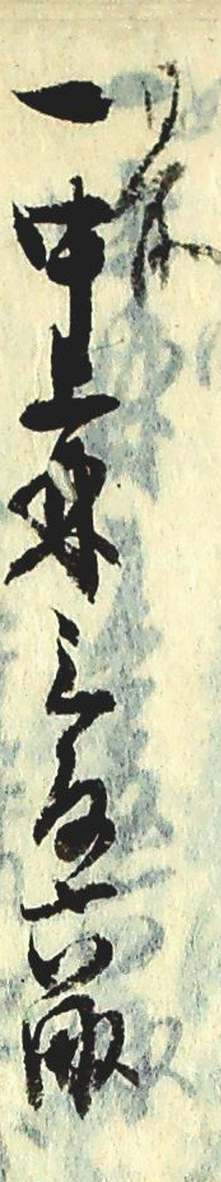一中上林三反六畝
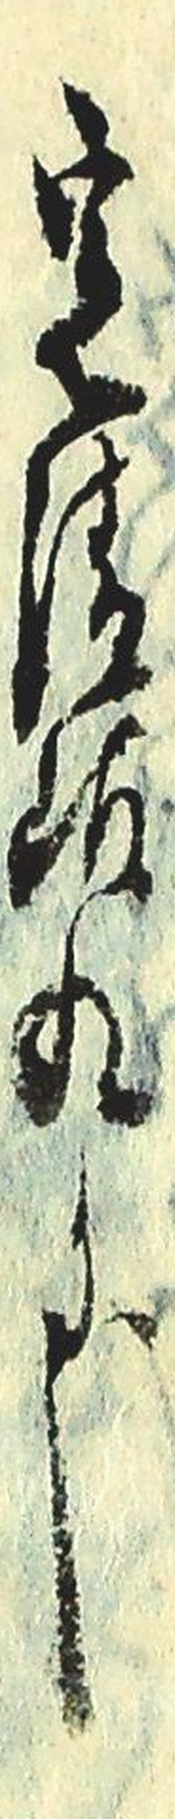定請銀九匁
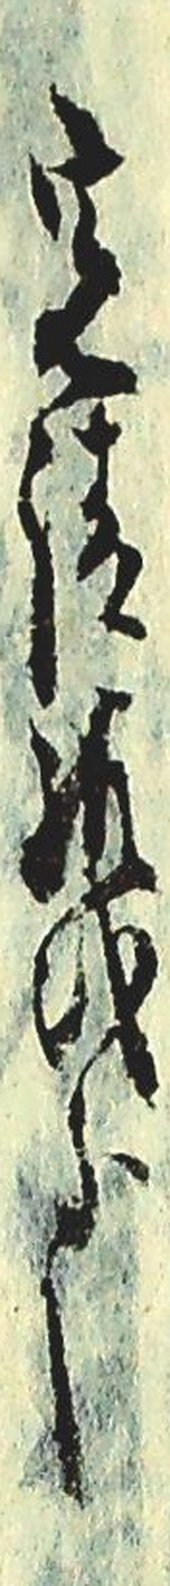定請銀弐匁
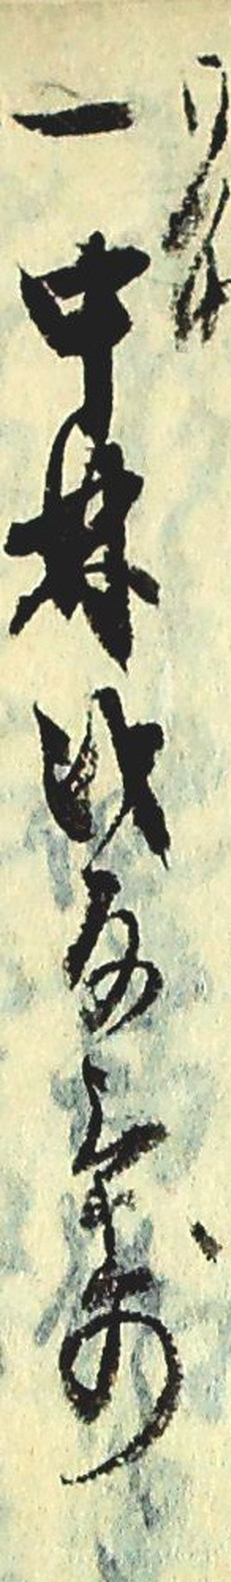一中上林弐反三歩
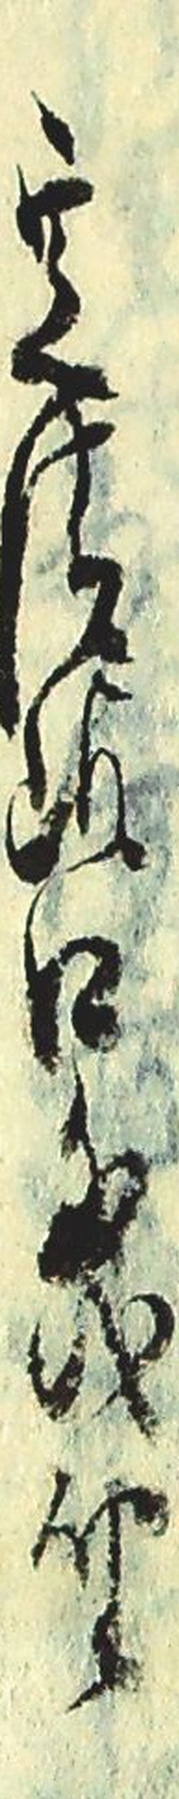定請銀四匁弐厘
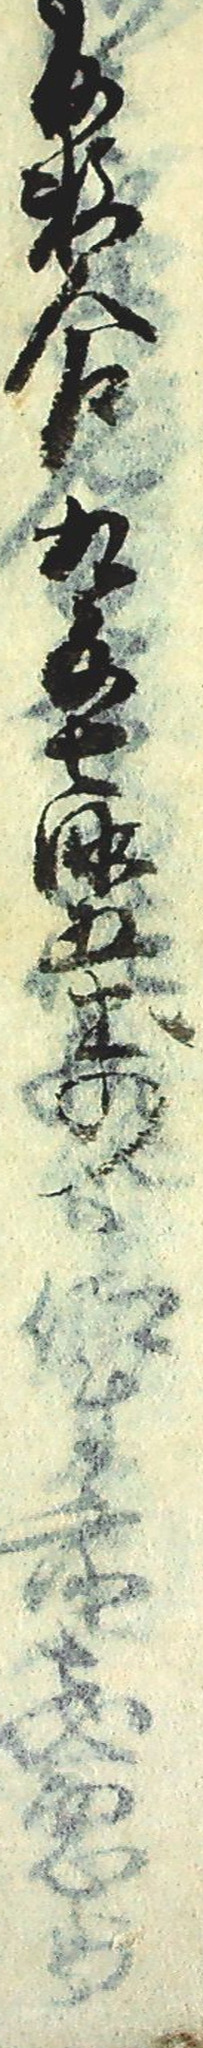単数合九反七畝五歩
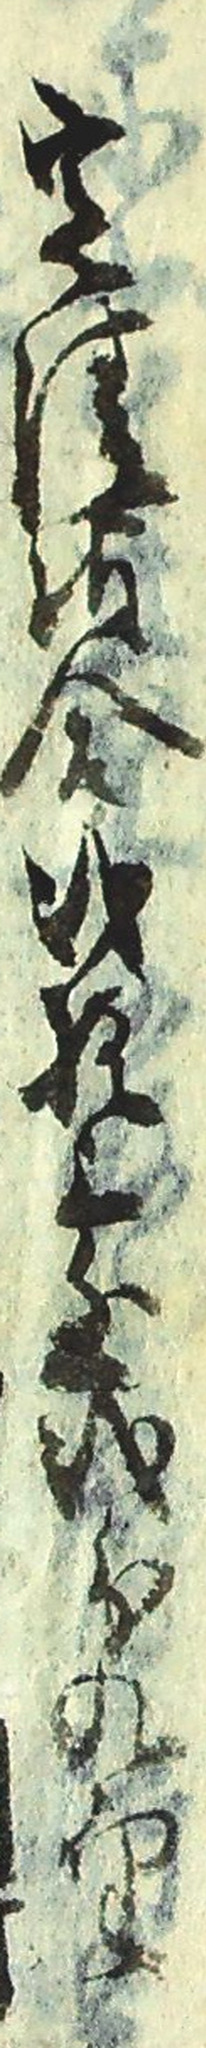定請銀合弐拾三匁弐分九厘
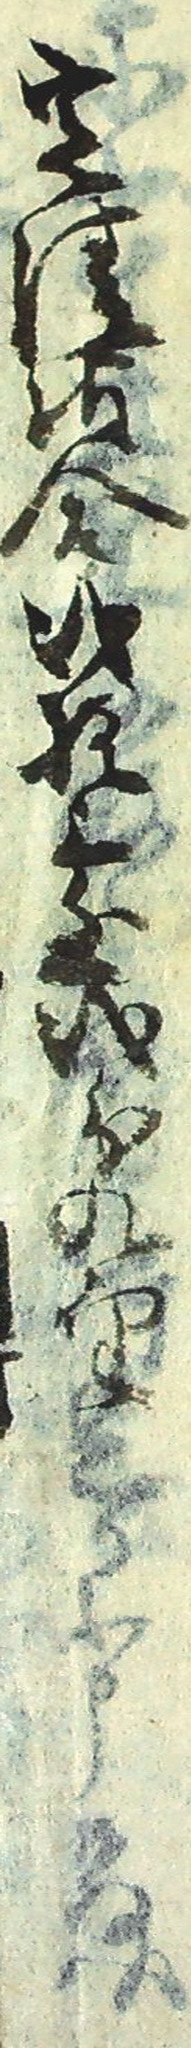定請銀合弐拾三匁弐分九厘
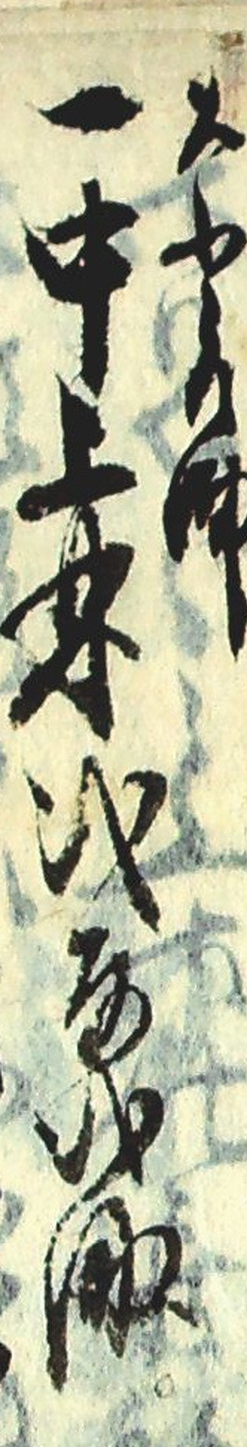一中上林三反六畝
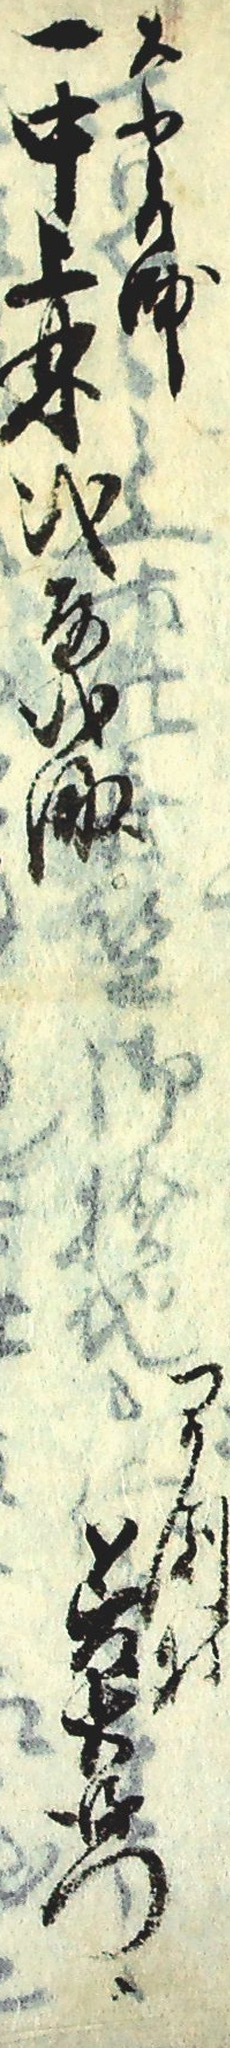一中上林弐反弐畝早淵村
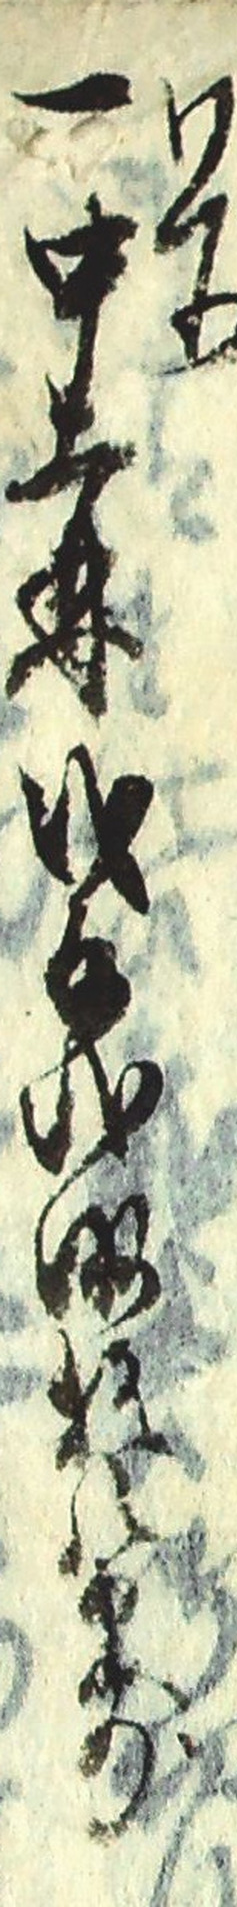一中上林弐反弐畝拾八歩
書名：諸御願書控(弐番）
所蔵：鳴門教育大学 Naruto University of Education
